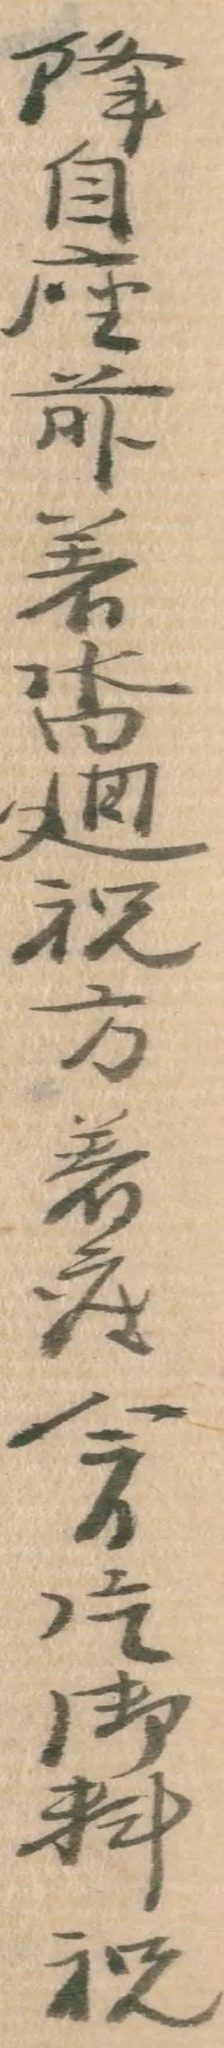降自座前着沓、廻祝方着座、今日片御料、祝
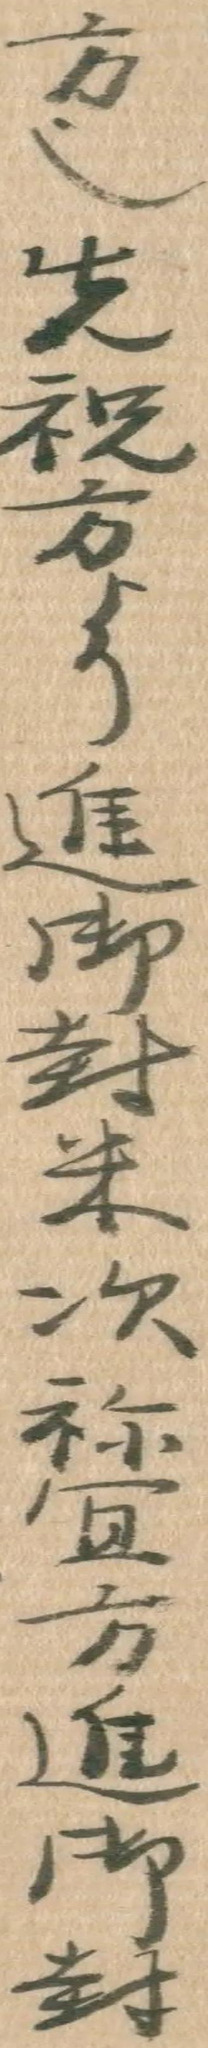方也、先祝方より進御對米、次称宜方進御封
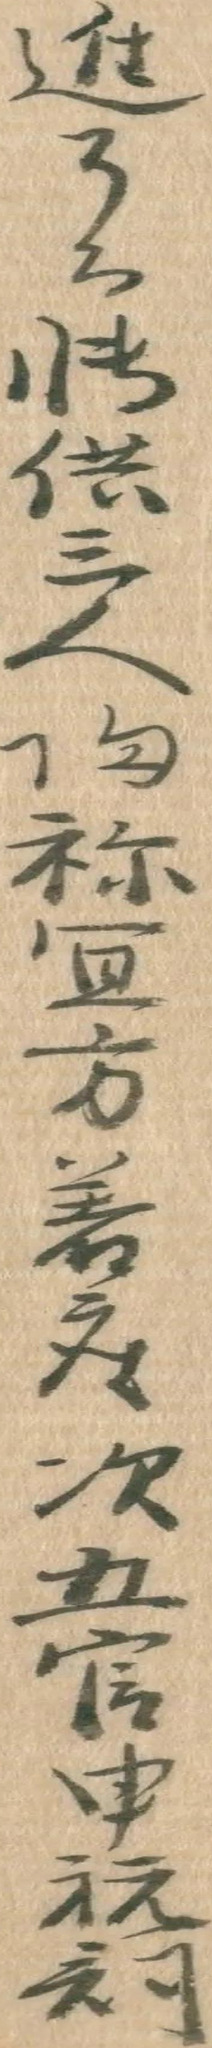進了而、轉供三人帰称宜方着座、次五官申祝詞、
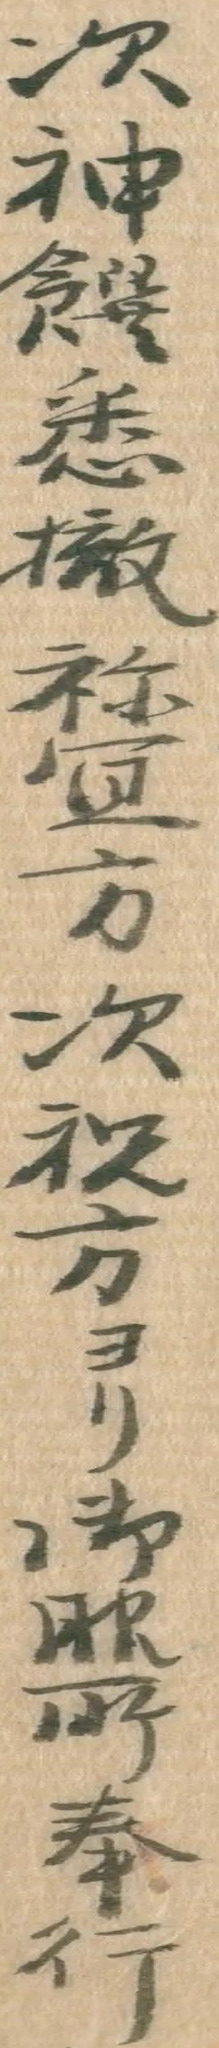次神饌悉撤称宜方、次祝方ヨリ御服所奉行
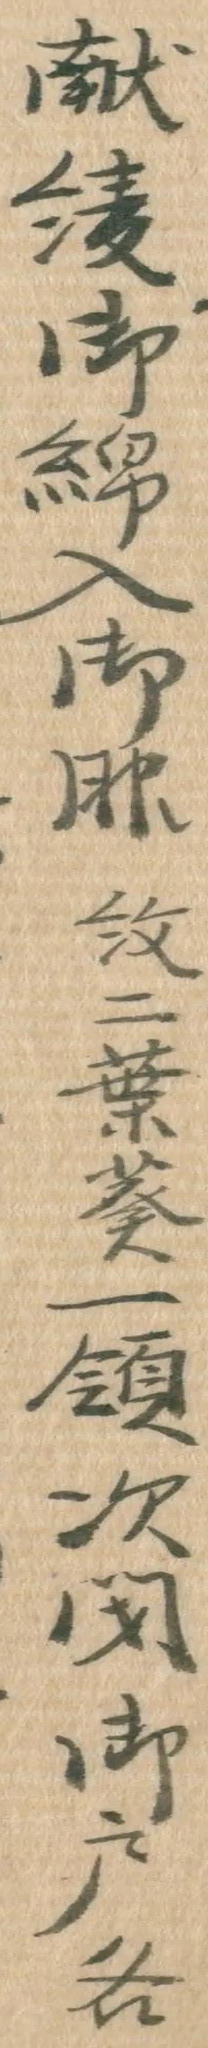献綾御綿入御服紋二葉葵一領、次閉御戸、各
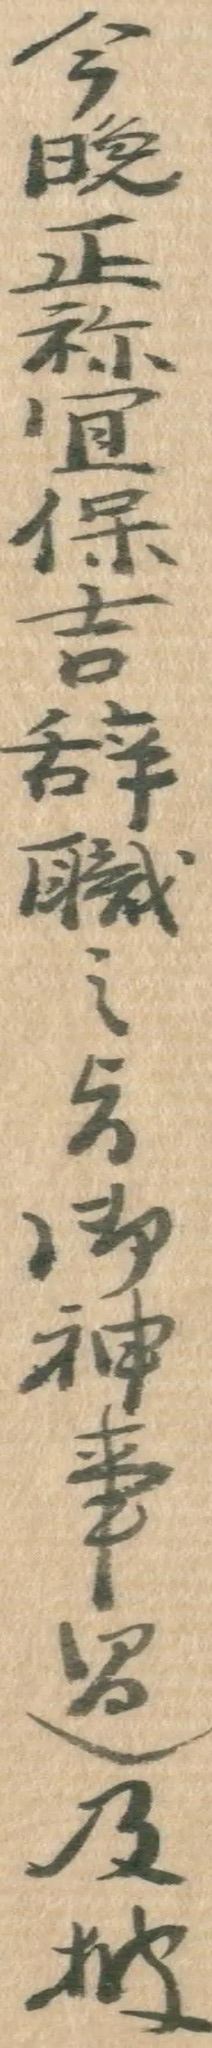今晩正称宜保吉辞職之旨、御神事過及披
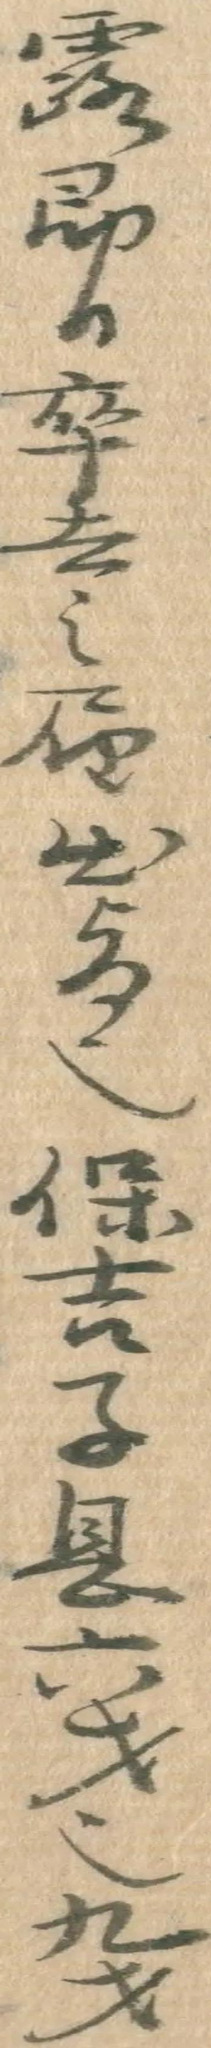露、即日卒去之届出旨也、保吉子息六才也、九才
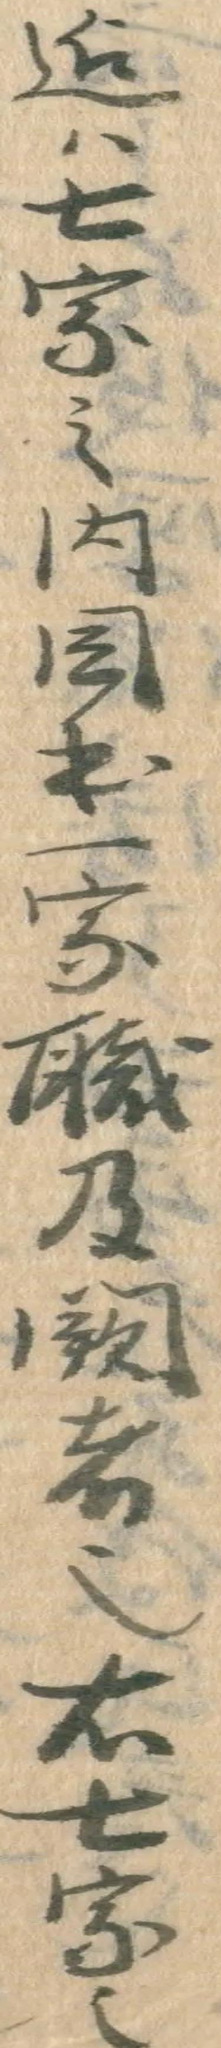迄ハ七家之内岡本一家職及闕者也、右七家之
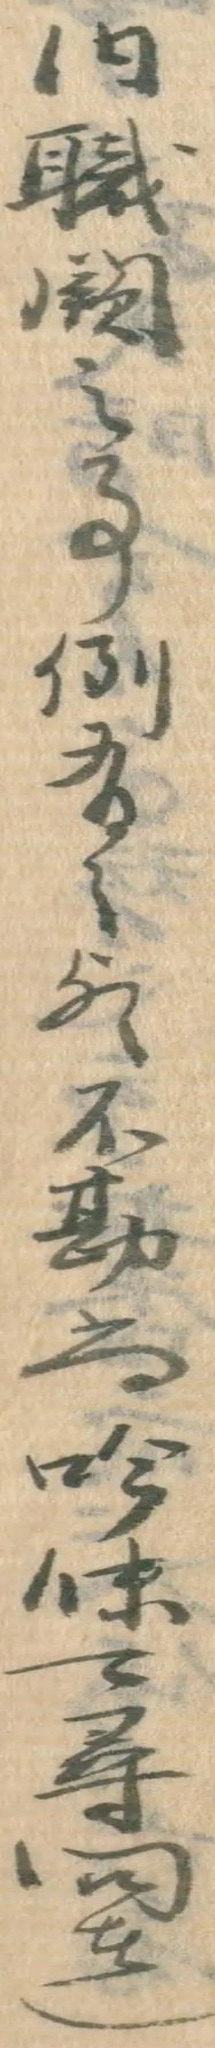内、職闕之事例有之歟不勘、尚吟味可尋問在

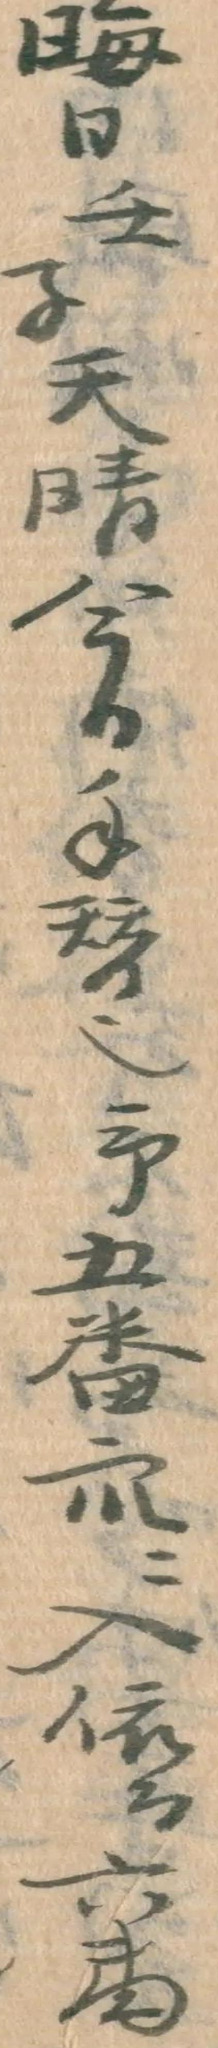晦日壬子天晴、今日手替也、予五番衆ニ入、依而六番
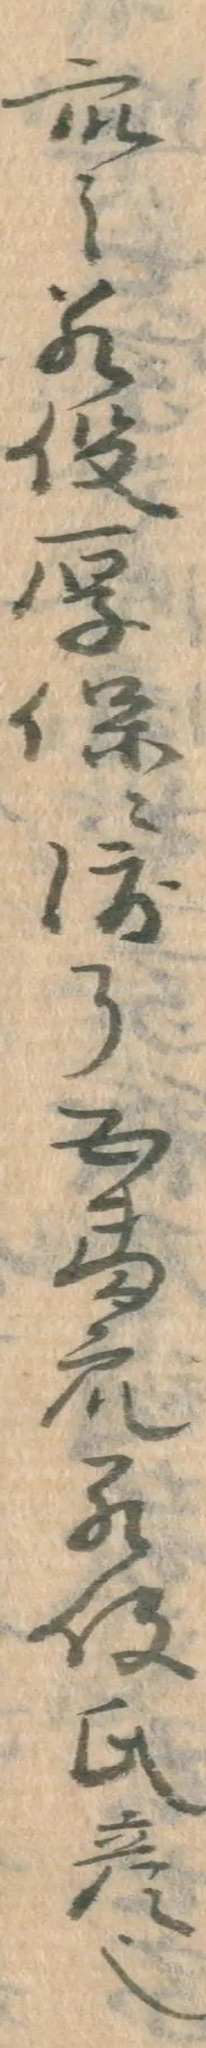衆之若役厚保ニ渡了、五番衆罷役氏彦也、

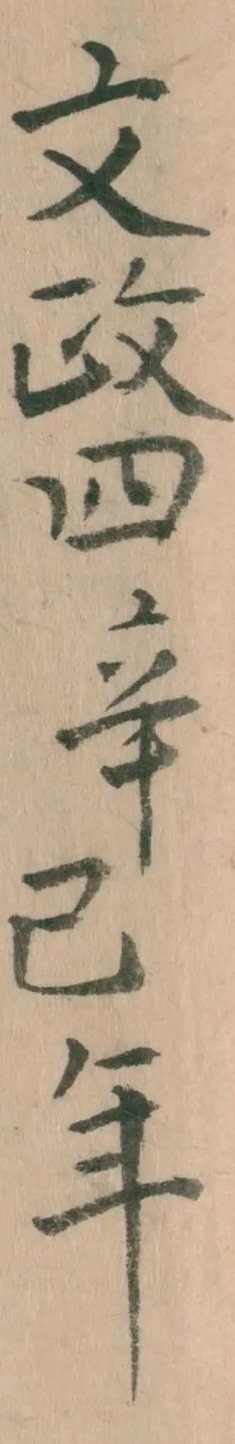文政四辛巳年
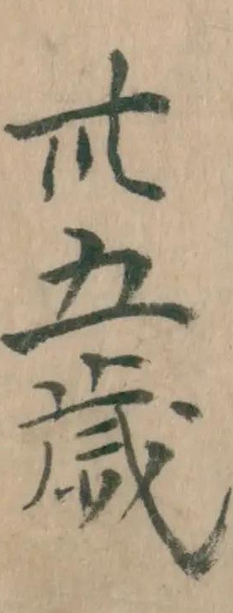卅五歳
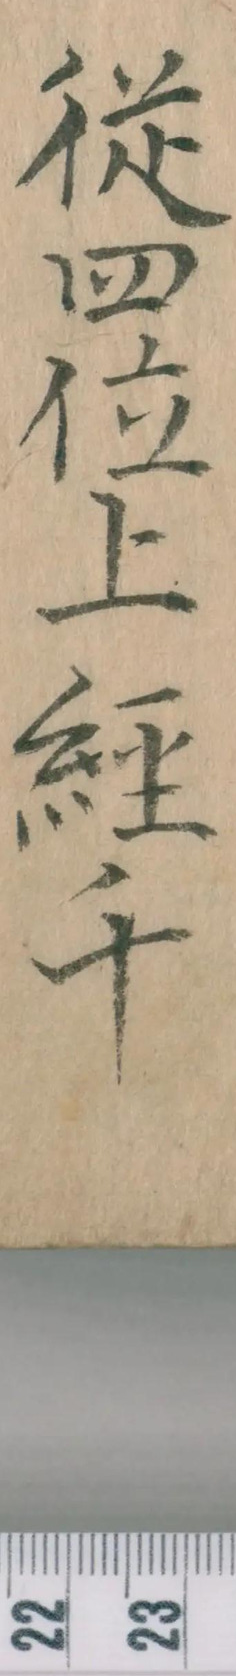従四位上経千
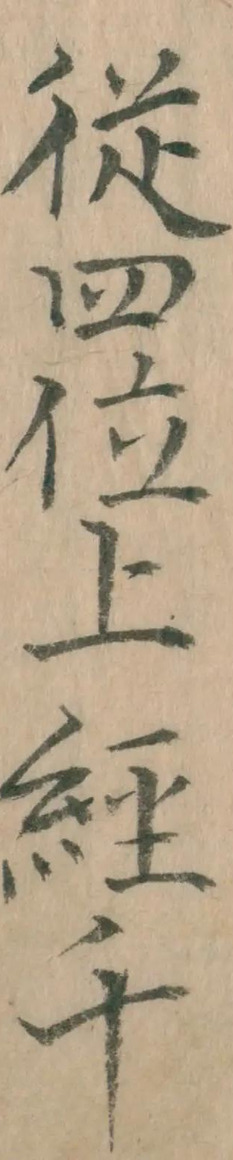従四位上経千

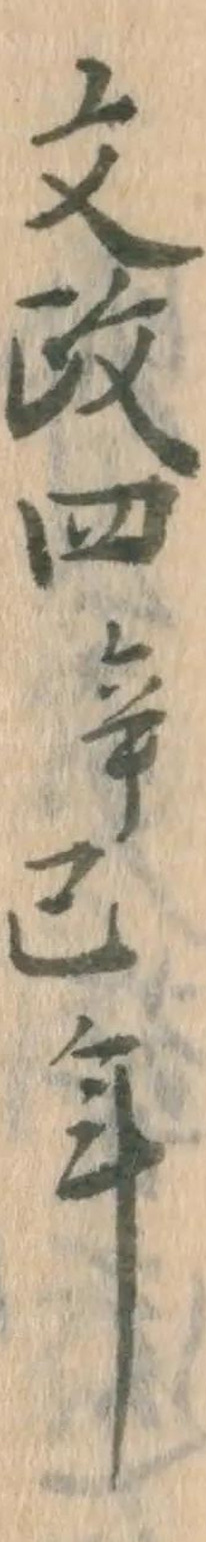文政四辛巳年
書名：賀茂社記録. 第63冊
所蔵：国立国会図書館 National Diet Library, JAPAN
